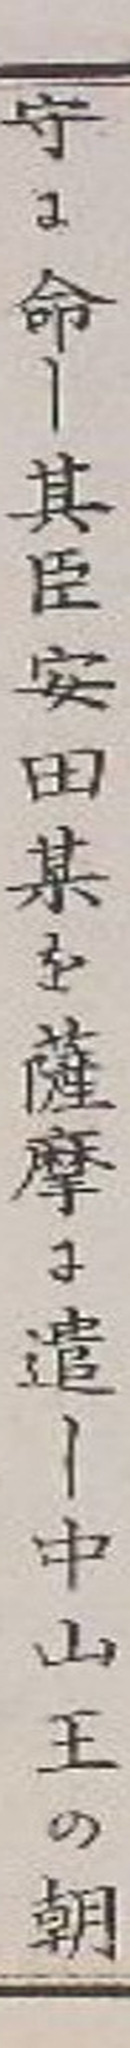守に命し其臣安田某を薩摩に遣し中山王の朝
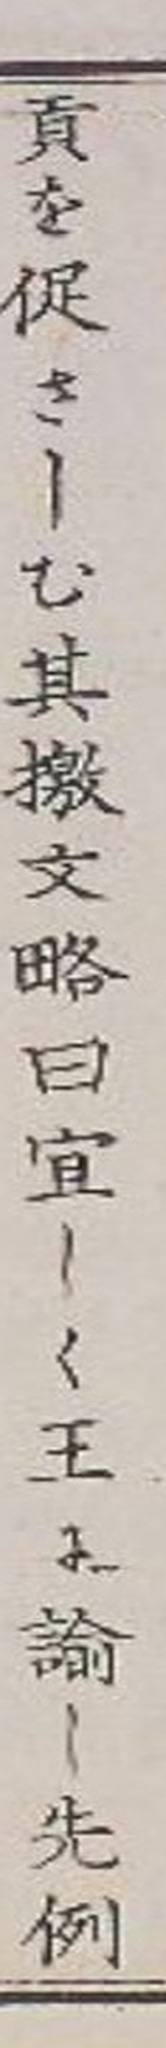貢を促さしむ其檄文略曰宜しく王に諭し先例
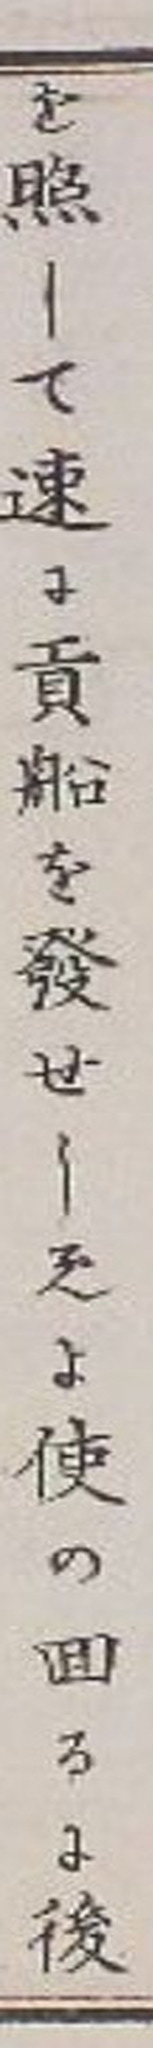を照して速に貢船を発せしめよ使の回るに後
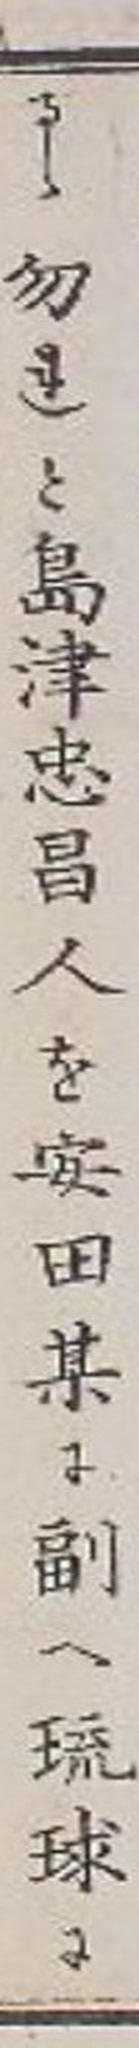るゝ勿れと島津忠昌人を安田某に副え琉球に
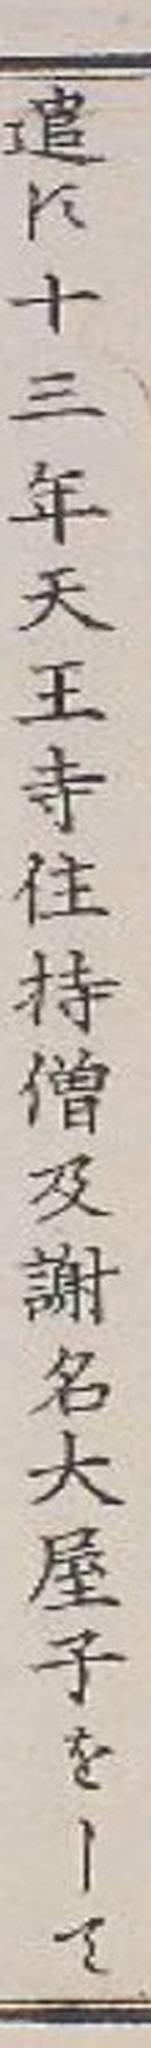遣す十三年天王寺住持僧及謝名大屋子をして
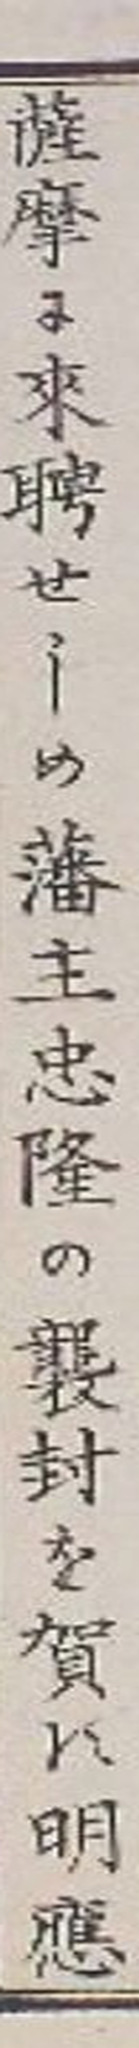薩摩に来聘せしめ藩主忠隆の襲封を賀す明応
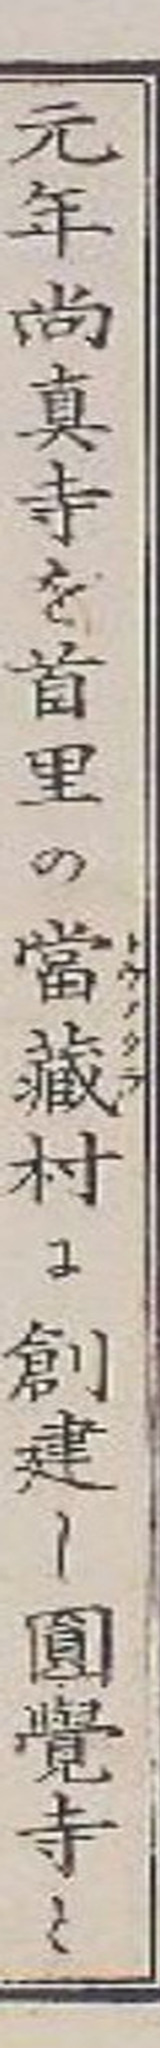元年尚真寺を首里の当蔵村に創建し円覚寺と
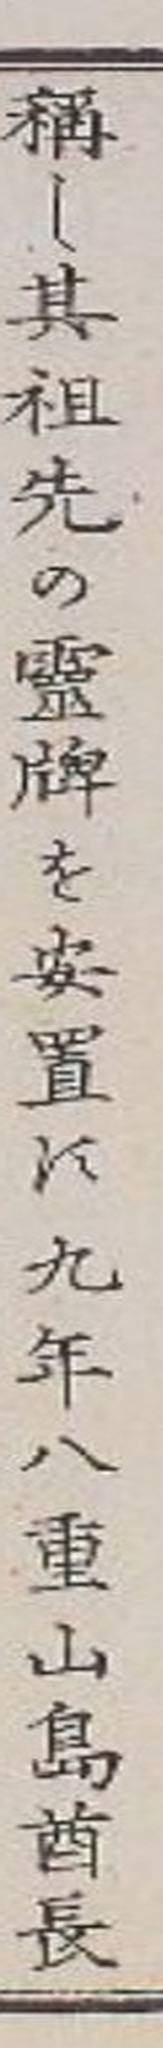称し其祖先の霊牌を安置す九年八重山島酋長
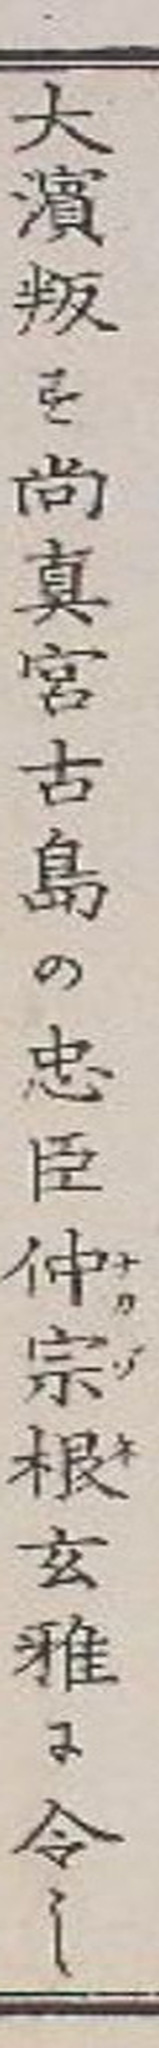大濱叛を尚真宮古島の忠臣仲宗根玄雅に令し
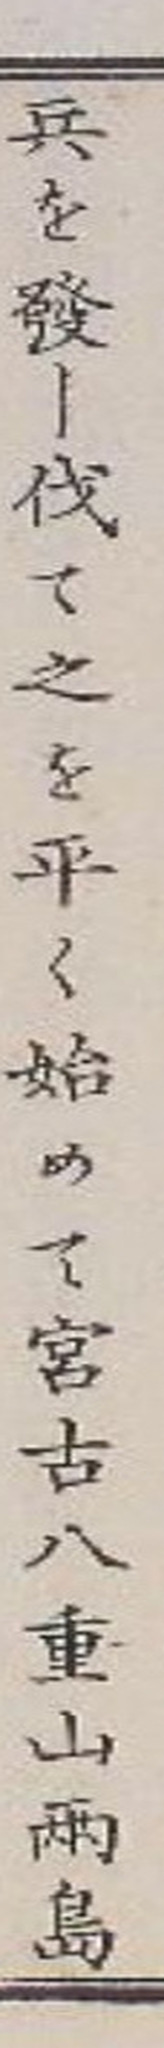兵を発し伐て之を平く始めて宮古八重山両島
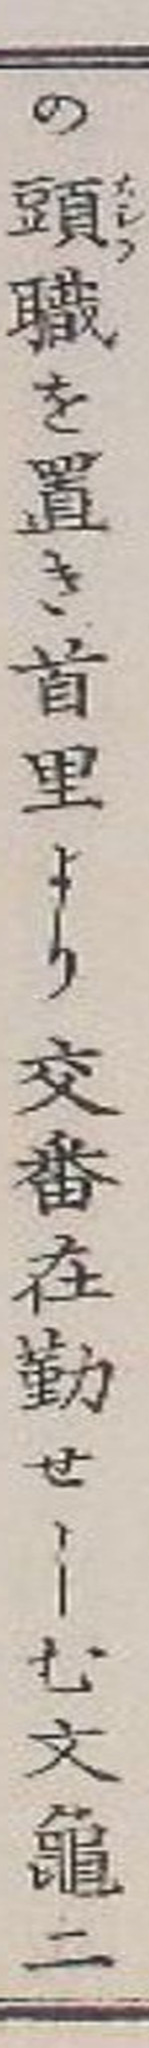の頭職を置き首里より交番在勤せしむ文亀二
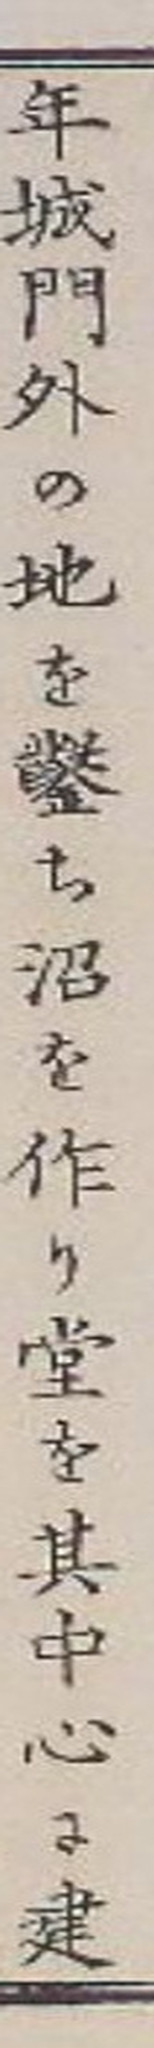年城門外の地を鑿ち沼を作り堂を其中心に建

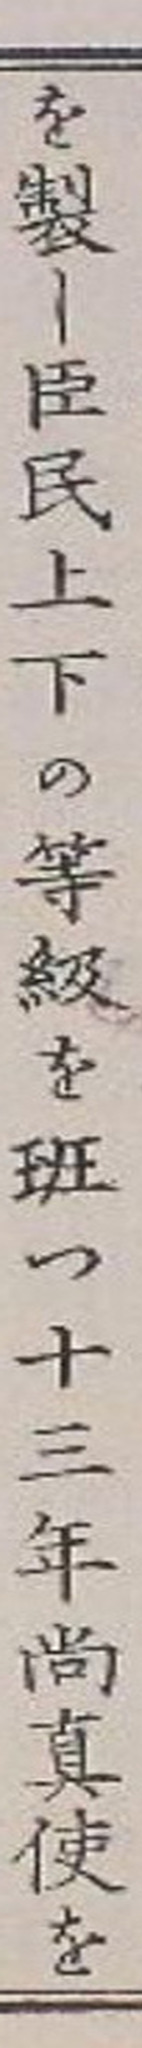を製し臣民上下の等級を班つ十三年尚真使を
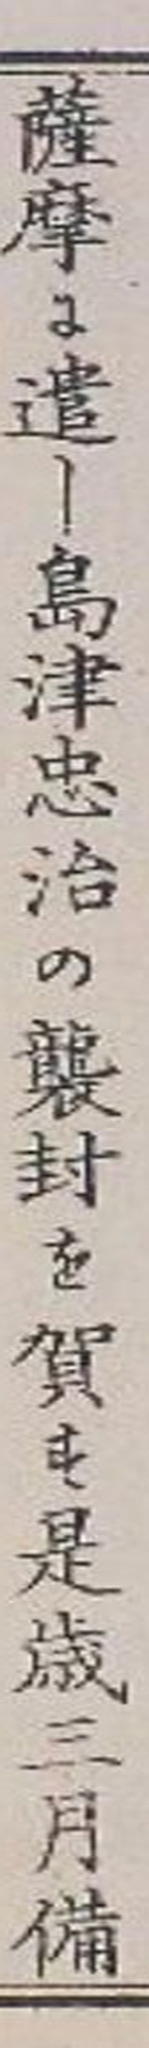薩摩に遣し島津忠治の襲封を賀す是歳三月備
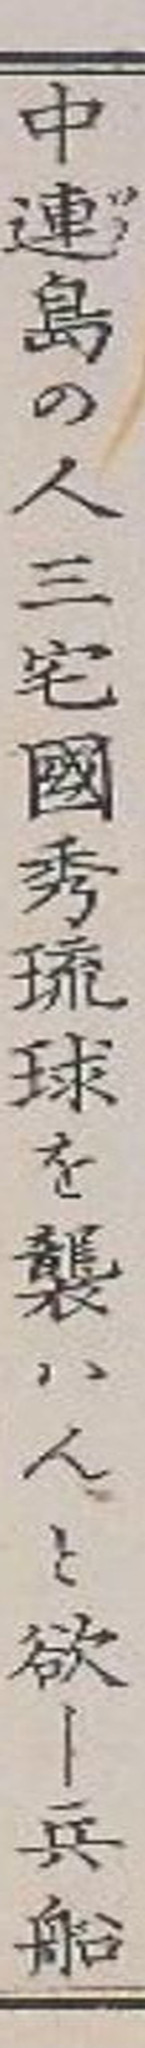中連島の人三宅国秀琉球を襲はんと欲し兵船
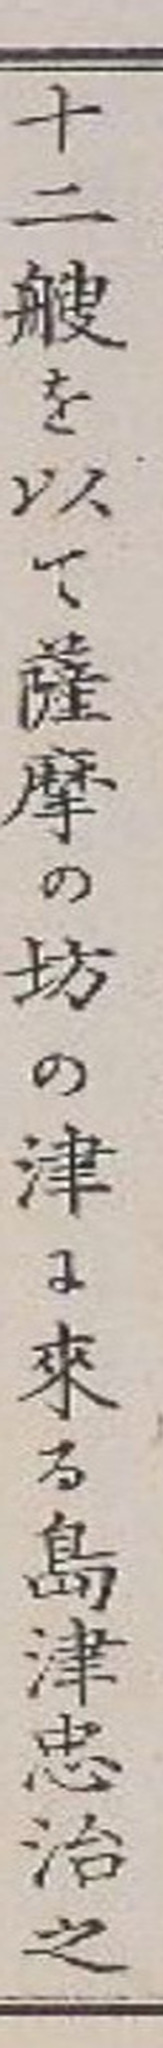十二艘を以て薩摩の坊の津に来る島津忠治之
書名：南島紀事 中
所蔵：University of the Ryukyus Library
